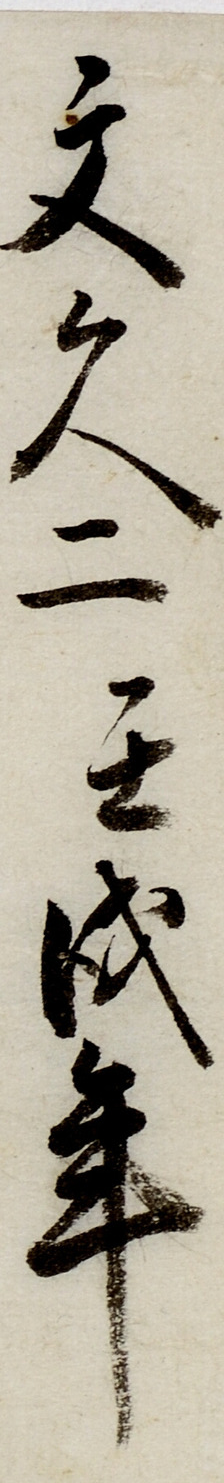文久二壬戌年
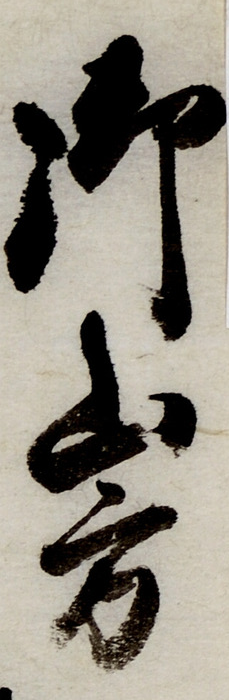御山方
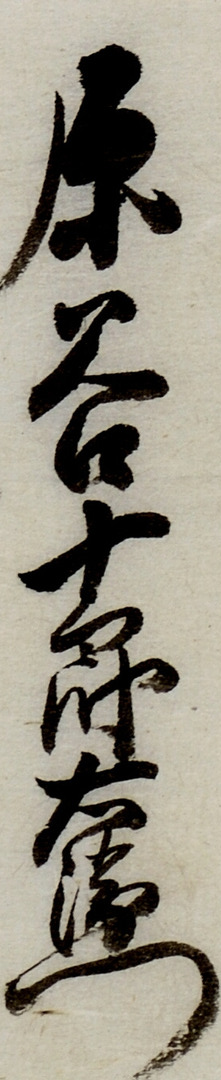原谷十郎右衞門
